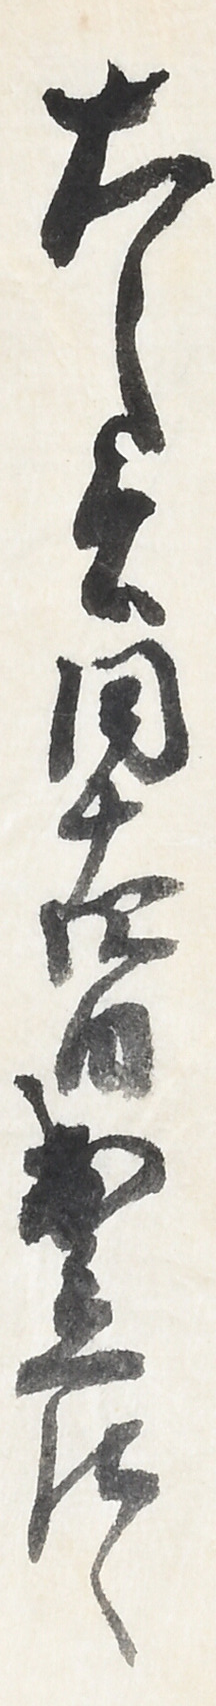右之同十四日出立仕候
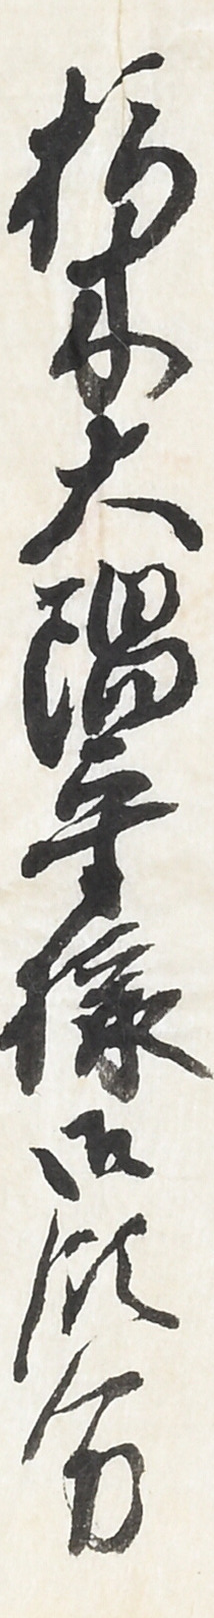朽木大隅守様御領分
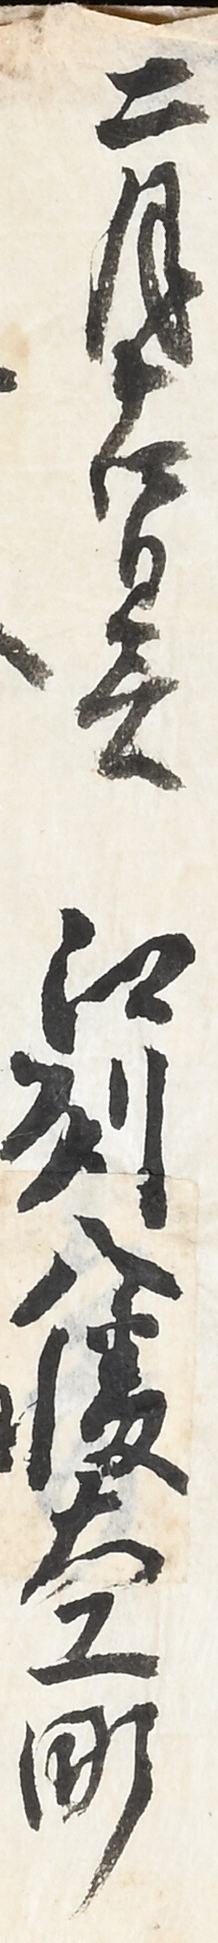二月十四日着江州八幡大工町
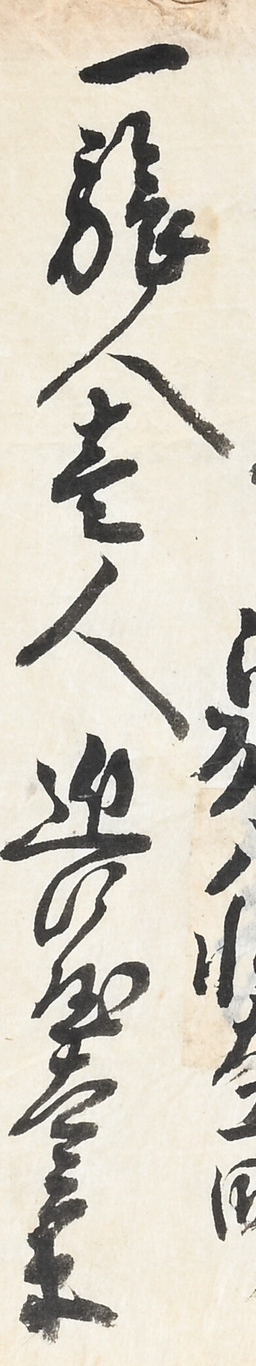一旅人壱人近江屋太兵衛
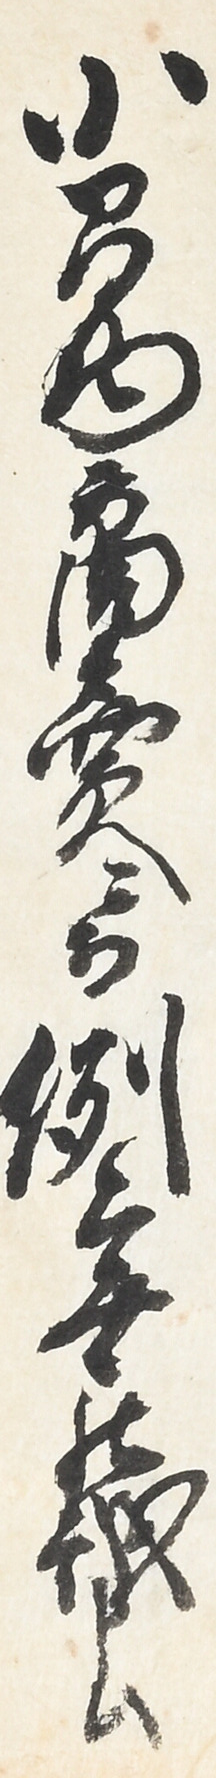小間物商売ニ而例年罷越申候
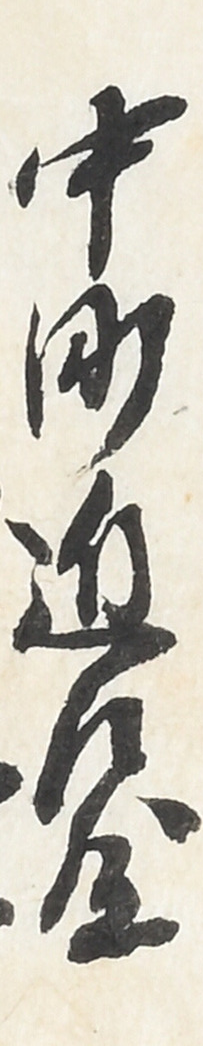中町近江屋
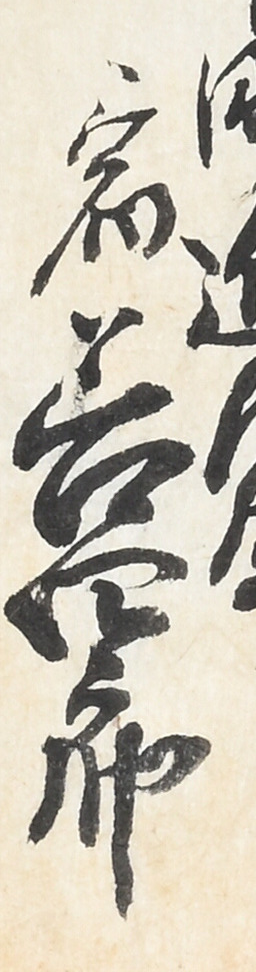宿善四郎
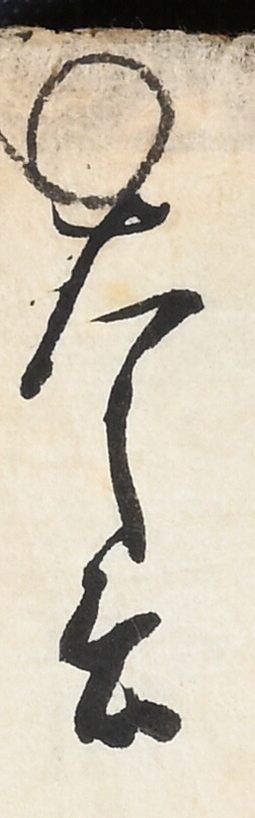〇右之者

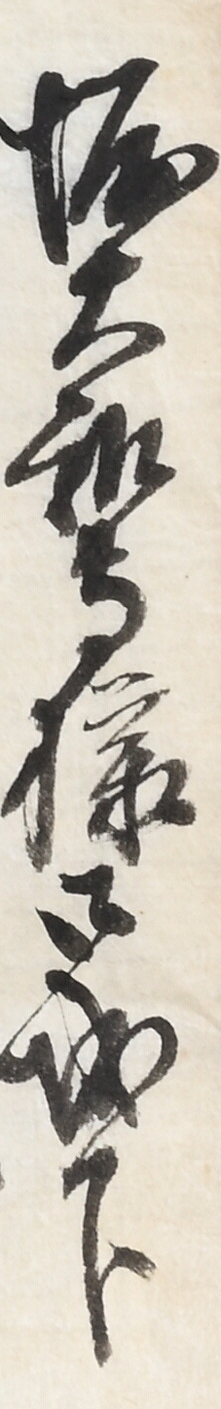堀大和守様御城下
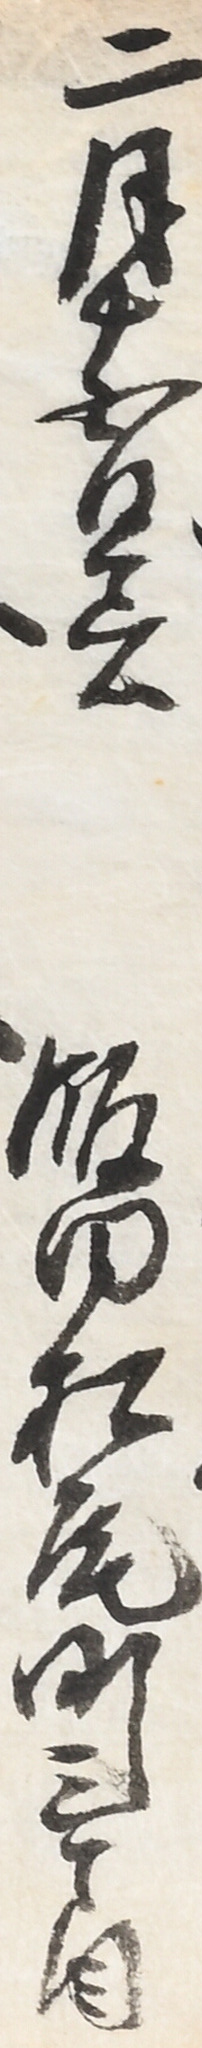二月十五日着飯田松尾町三丁目
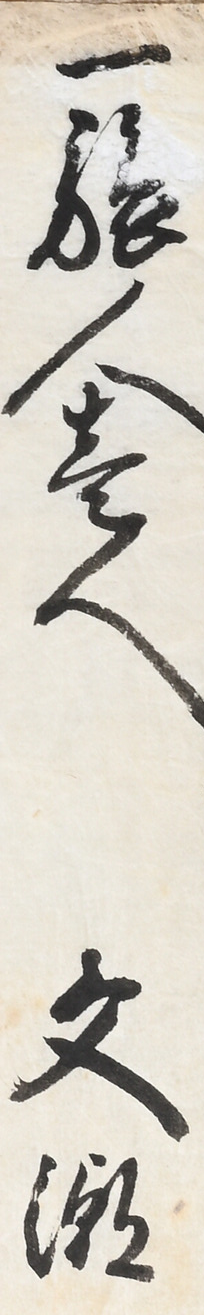一旅人壱人文潮
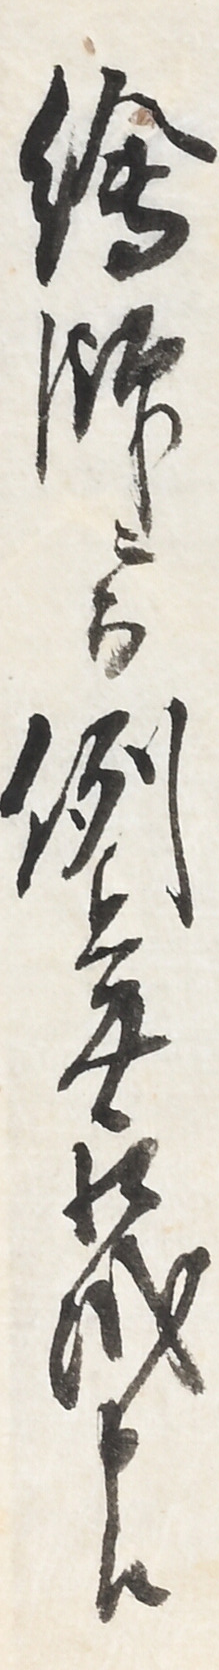絵師ニ而例年罷越申候
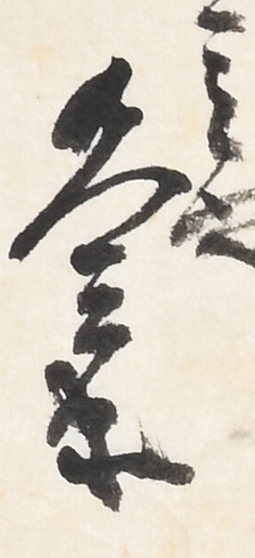久兵衛
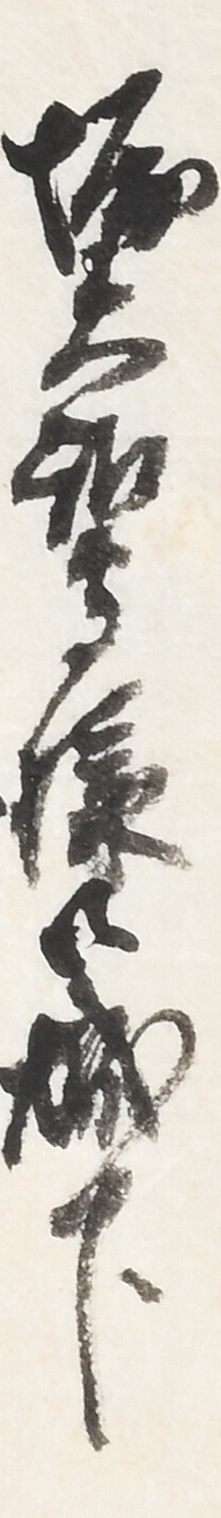堀大和守様御城下
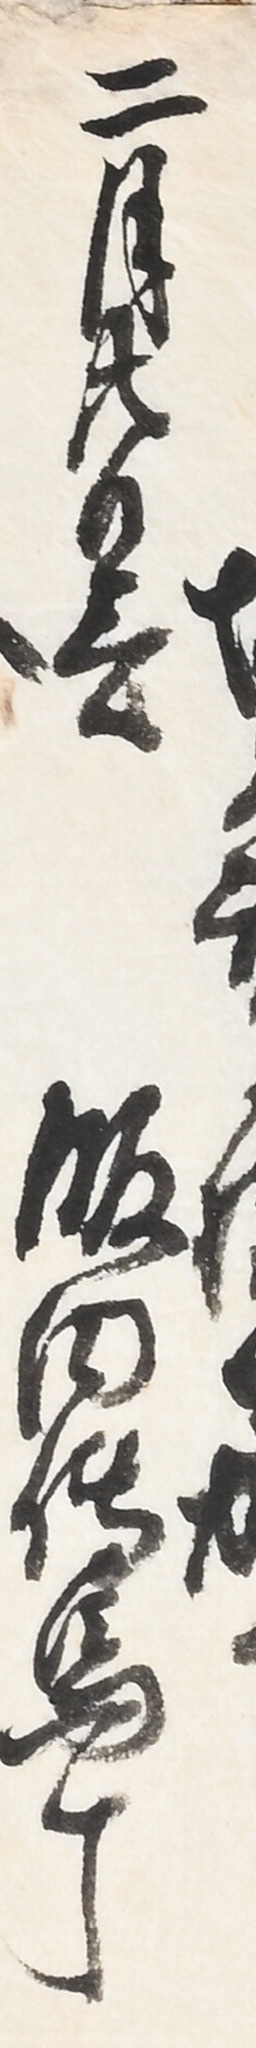二月廿日着飯田伝馬丁
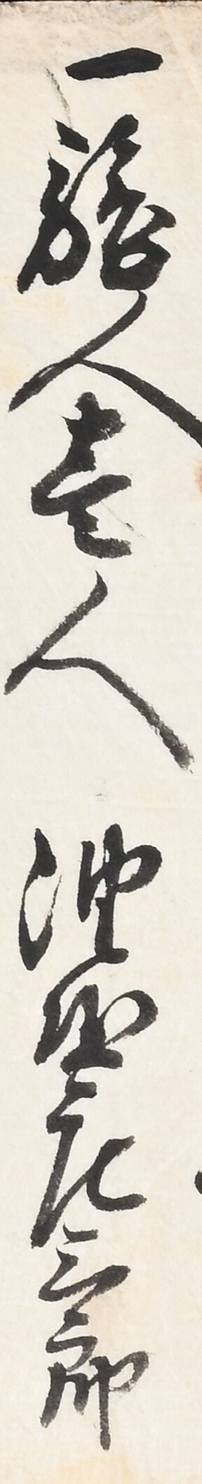一旅人壱人油屋庄三郎
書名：旅人泊控帳
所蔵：伊那市立高遠町図書館・合同会社AMANE
